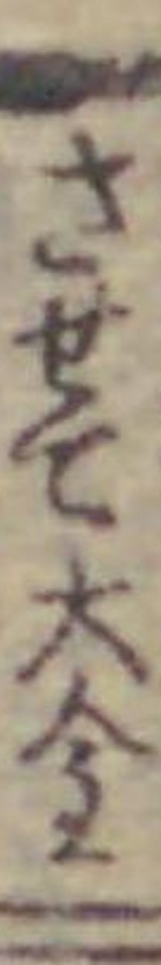させて大金
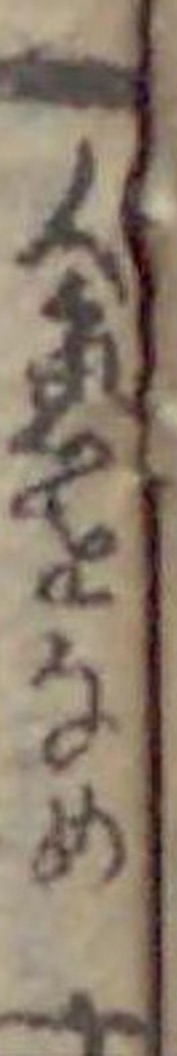人魚をなめ
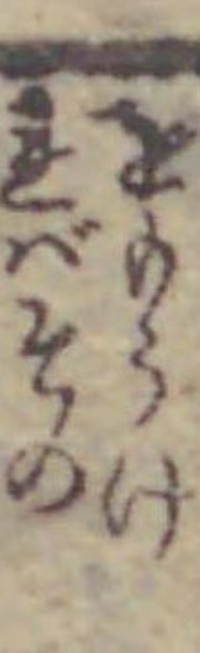ればその
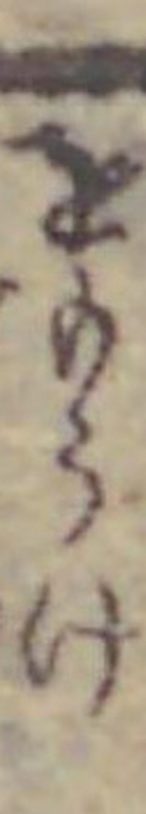をもうけ
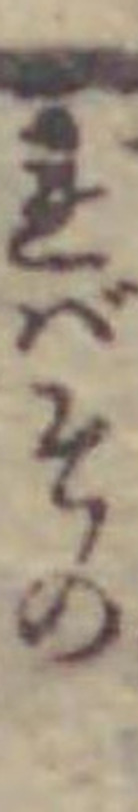ればその
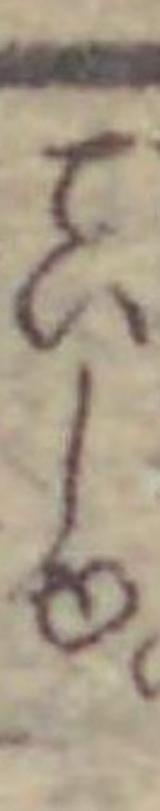ていしゆ
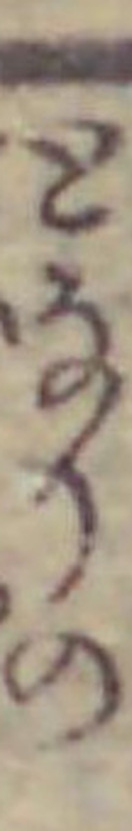となりの
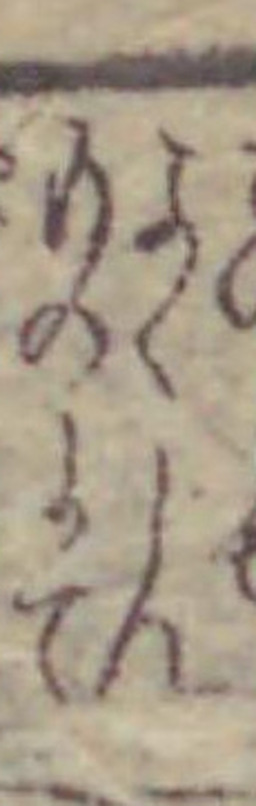ものにて
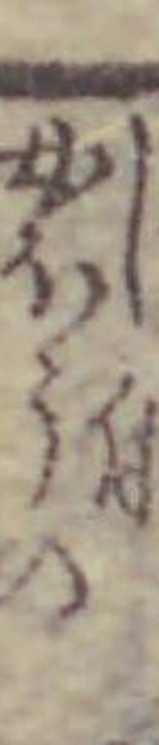女ほうの
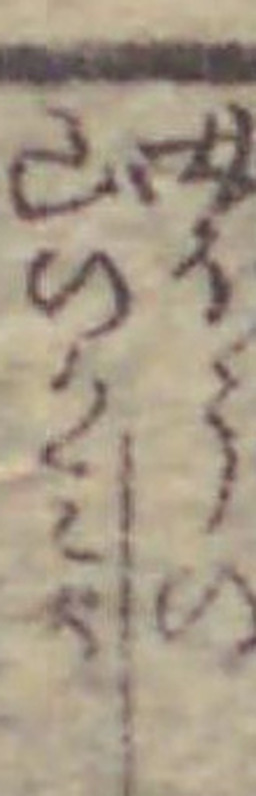山のかみが
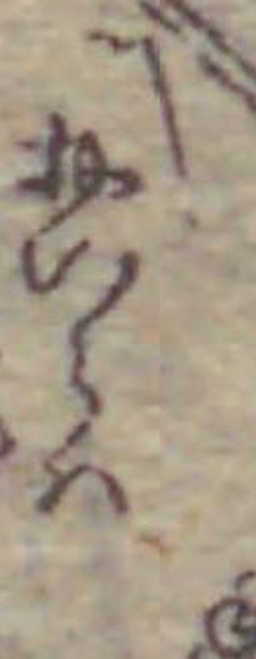〽おいらは
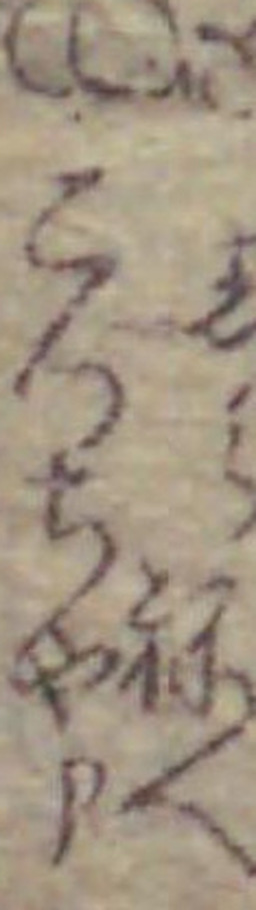こつちやァ
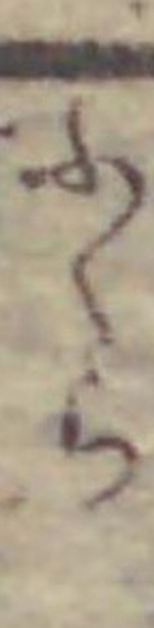ふくら
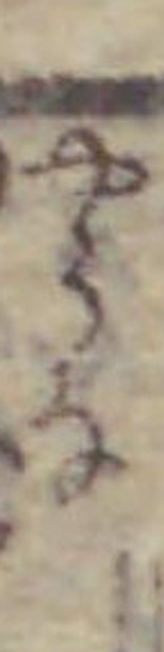やうな
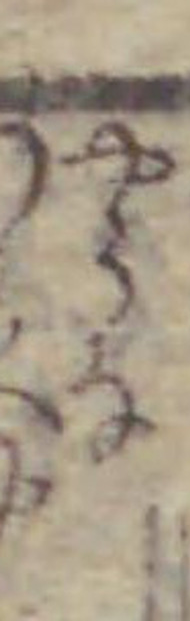やうな
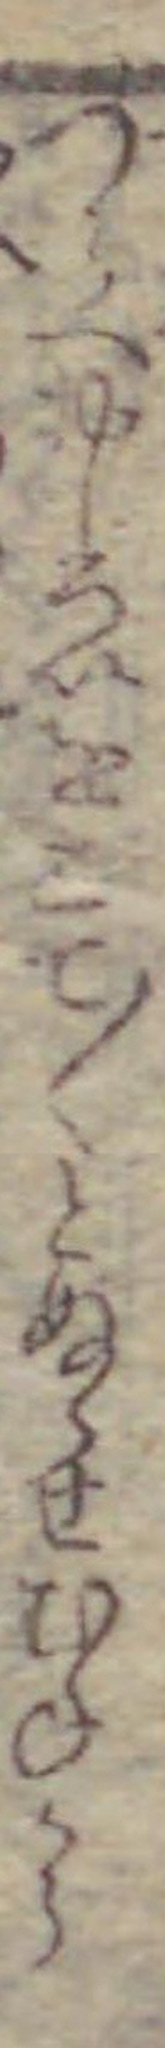つらへおしろいをこて〳〵とぬらせむねから
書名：箱入娘面屋人魚 3巻
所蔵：国立国会図書館 National Diet Library, JAPAN
